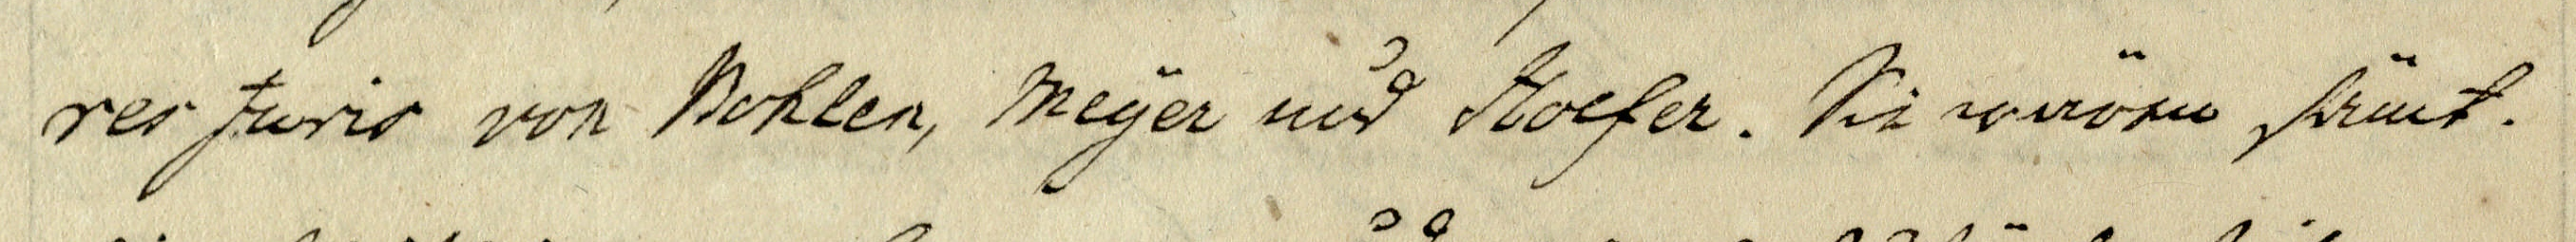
res Juris von Bohlen, Meÿer und Hoefer. Sie wären sämt¬
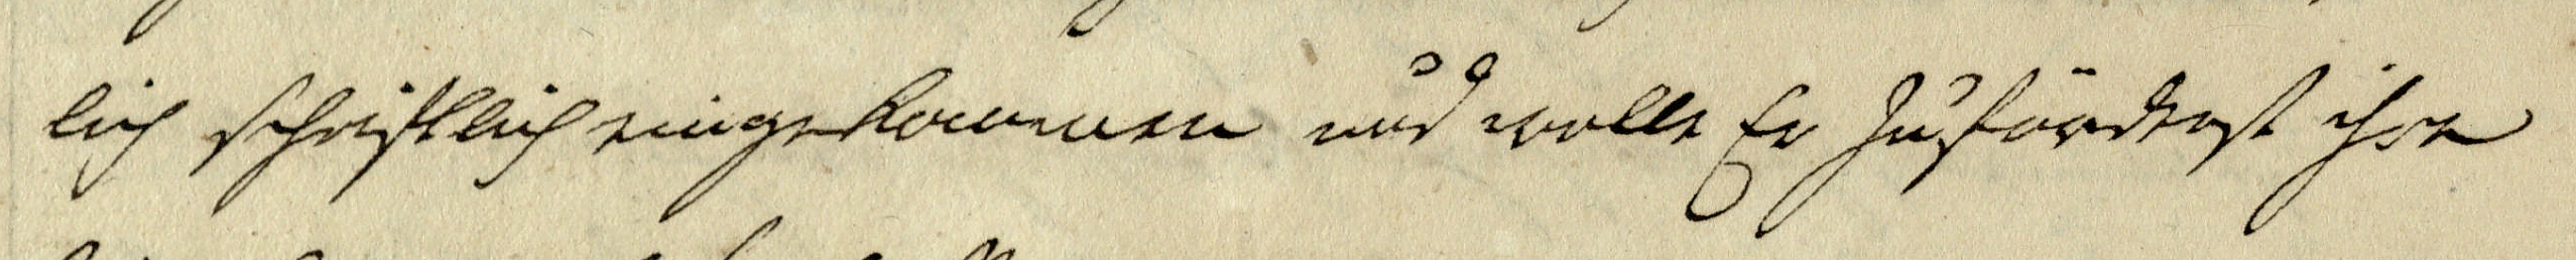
lich schriftlich eingekommen und wolle Er zuförderst ihre
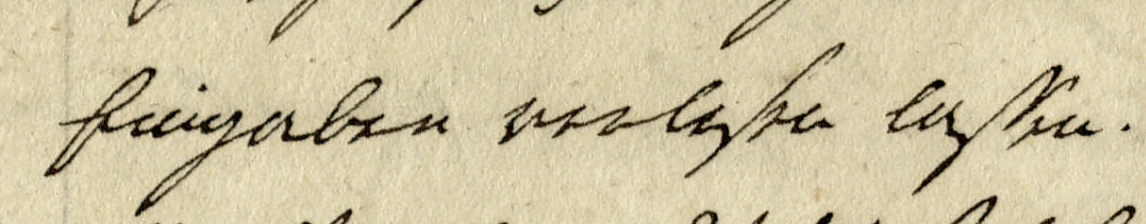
Eingaben verlesen lassen.
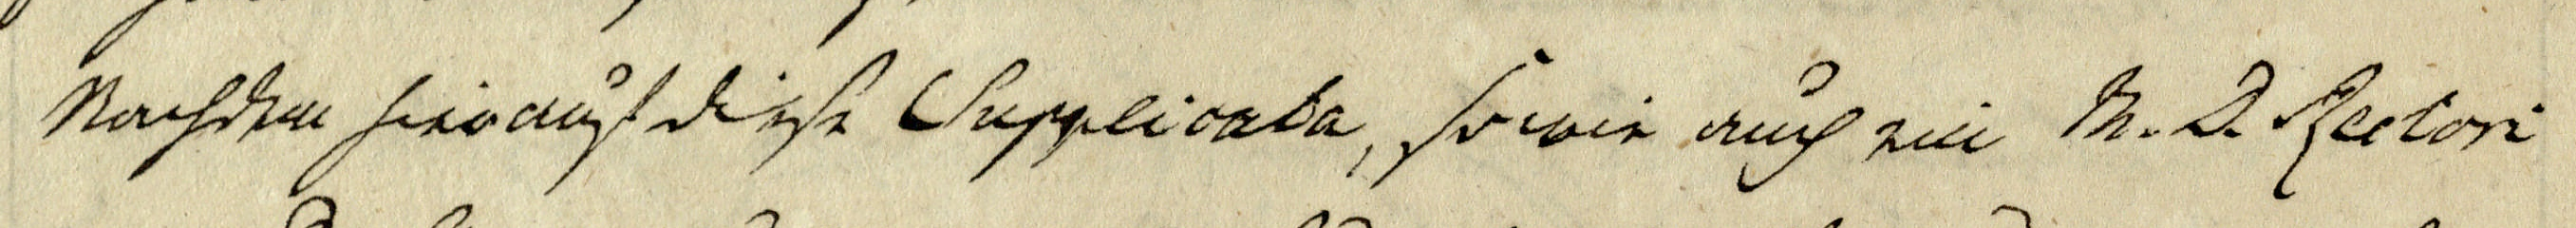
Nachdem hierauf diese Supplicata, so wie auch ein M. D. Rectori
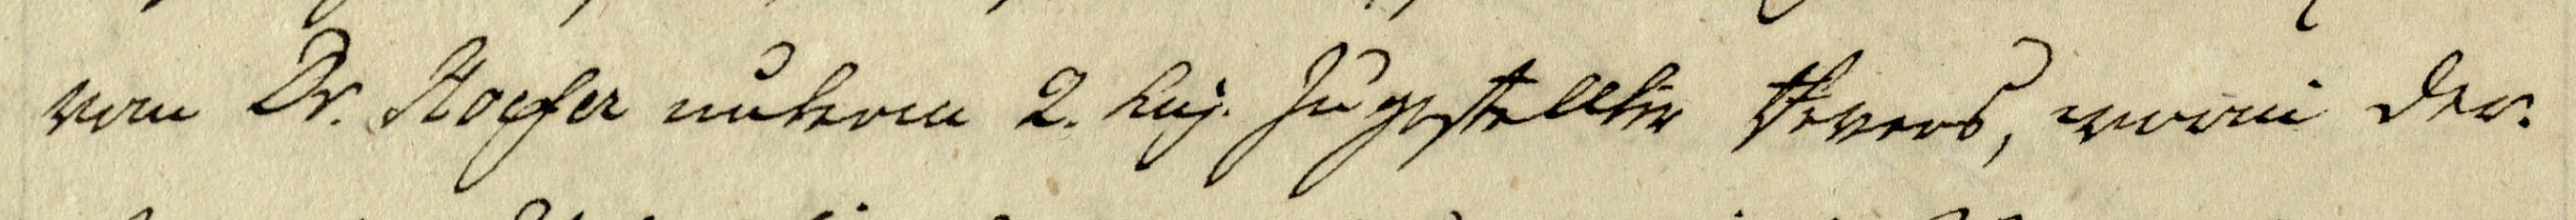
vom Dr. Hoefer unterm 2. huj. zugestellter Revers, worin der¬
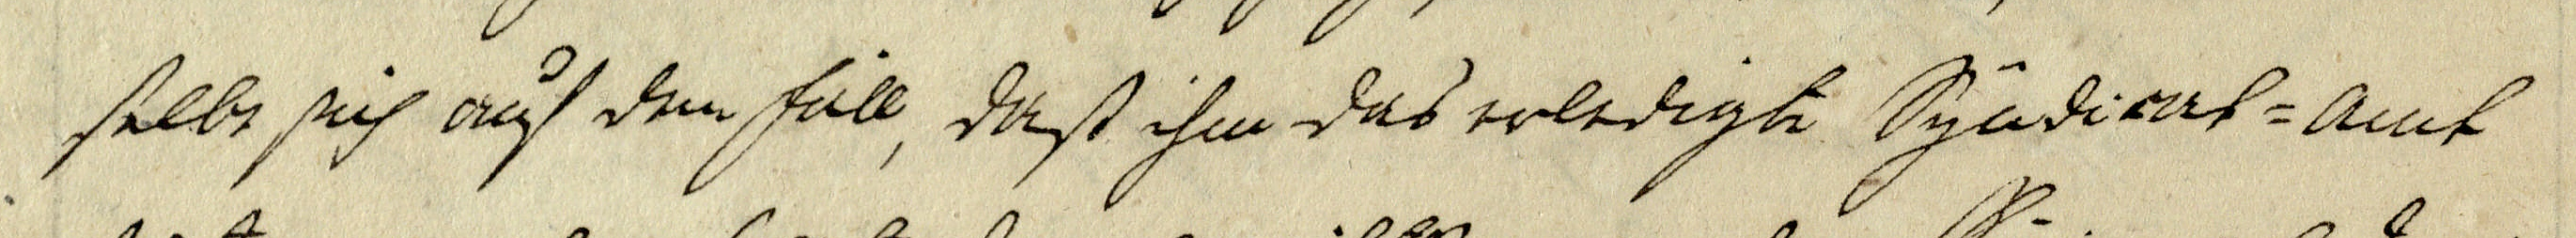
selbe sich auf dem Fall, daß ihm das erledigte Sÿndicat - Amt
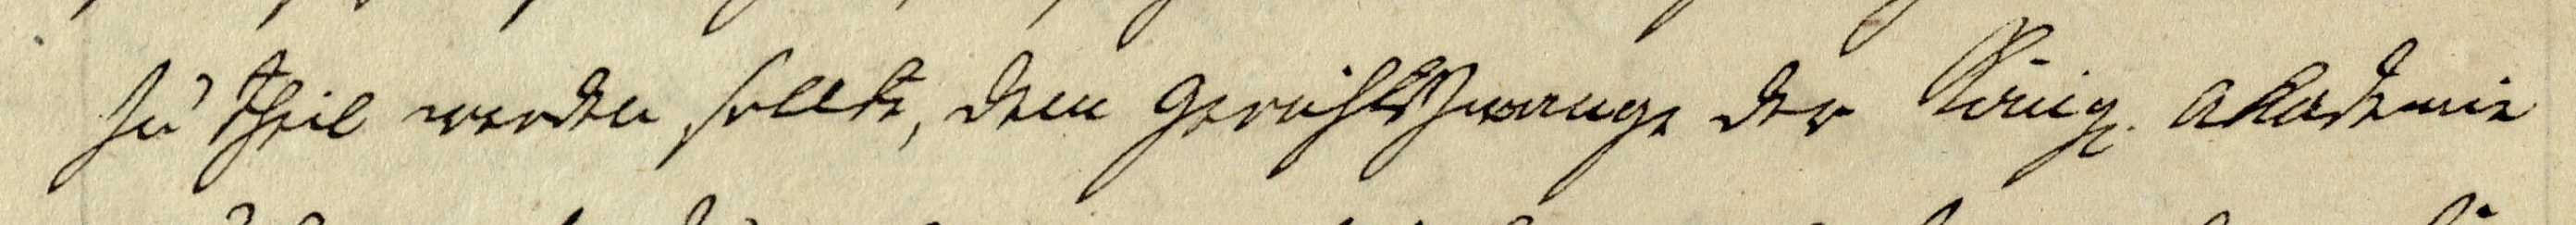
zu Theil werden sollte, dem Gerichtszwange der König. Akademie
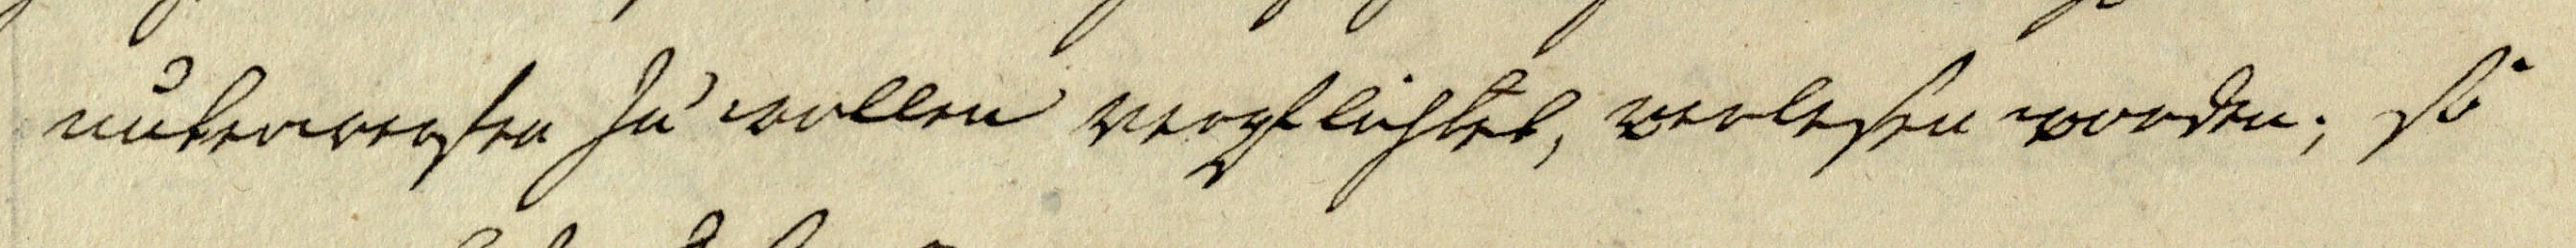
unterwerfen zu wollen verpflichtet, verlesen worde; so
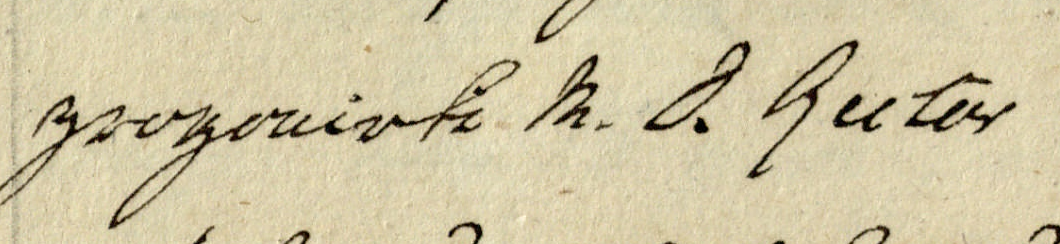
proponirte M. D. Rector
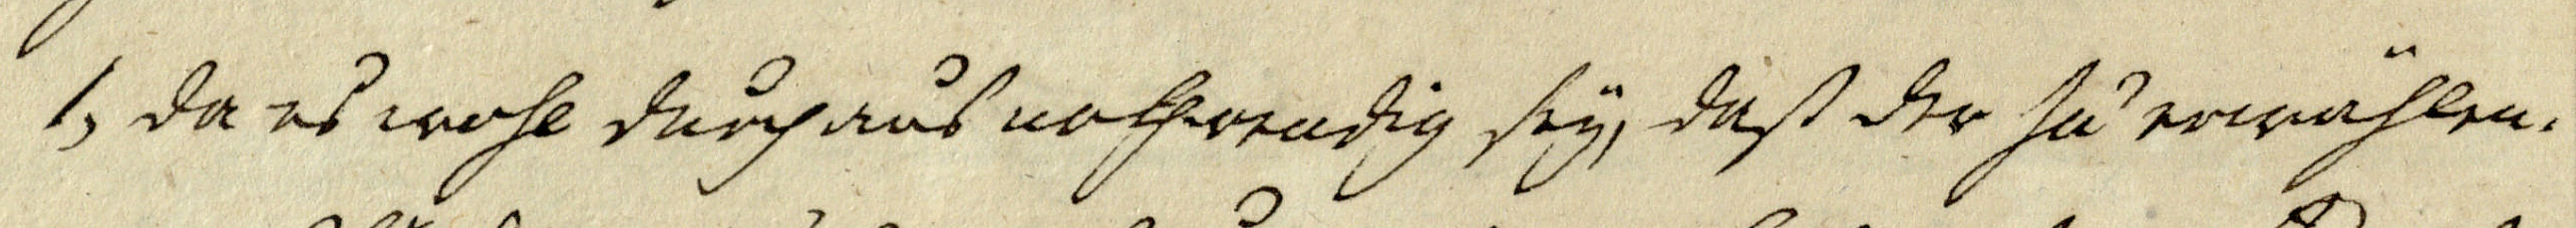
1., Da es wohl durchaus nothwendig seÿ, daß der zu erwählen¬
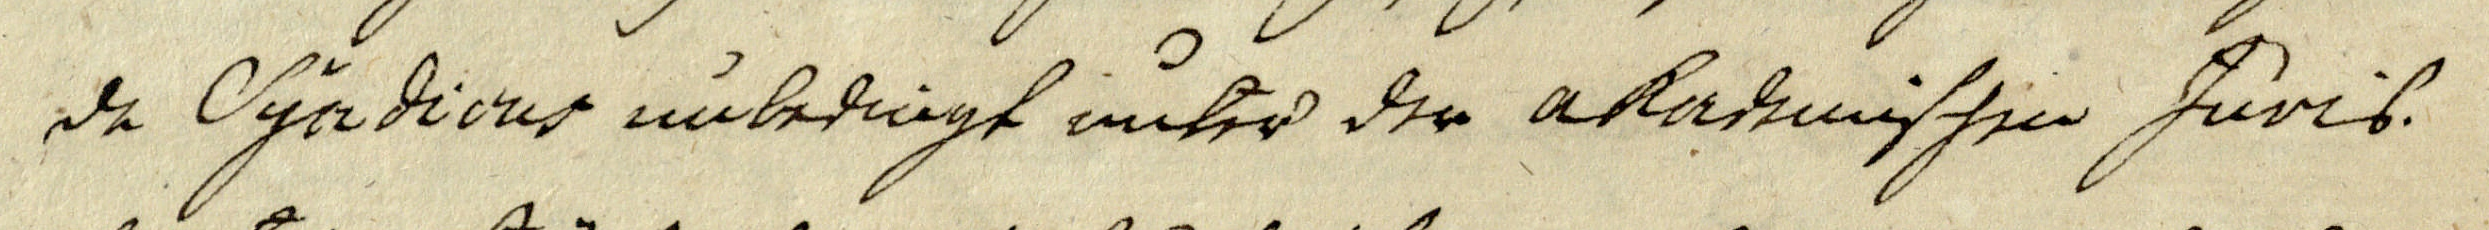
de Sÿndicus unbedingt unter der akademischen Juris¬
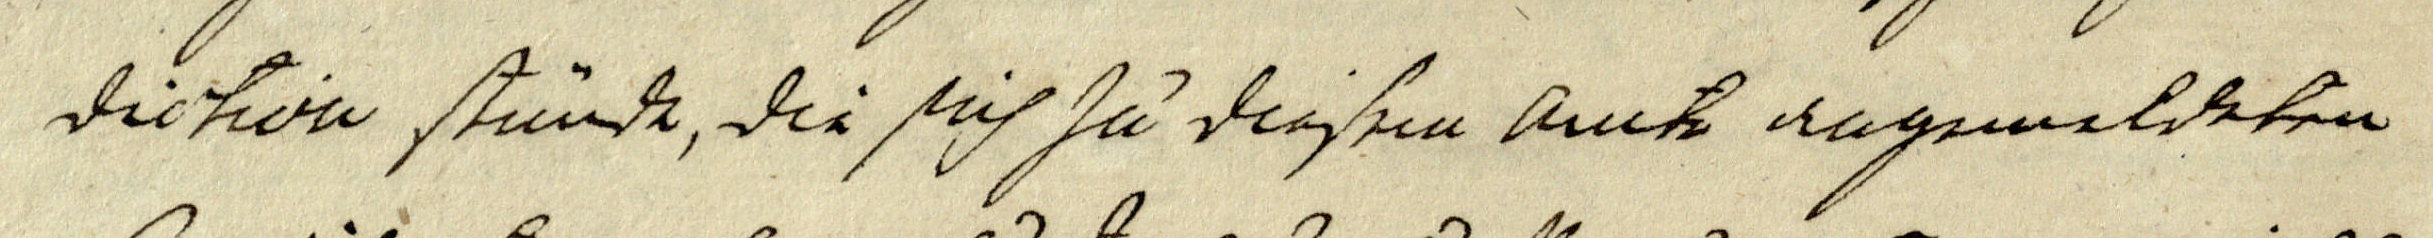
diction stünde, die sich zu diesem Amte angemeldeten
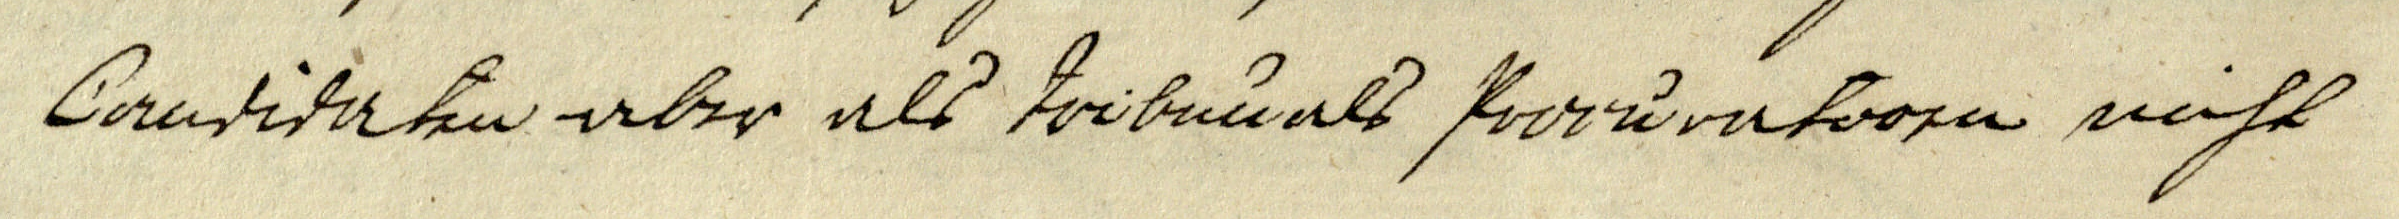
Candidaten aber als Tribunals Procuratoren nicht
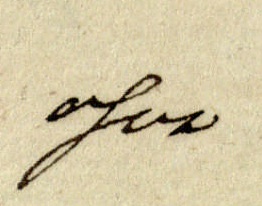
ohne
